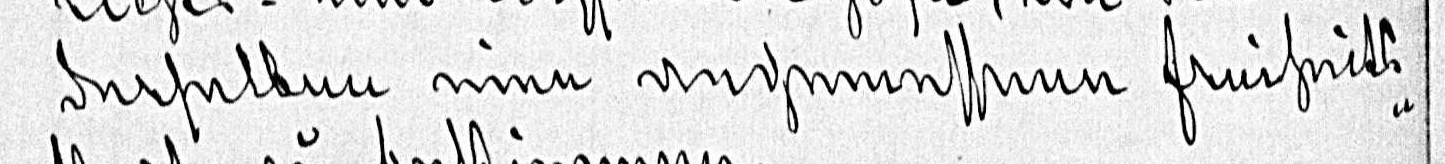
derselben eine angemessene Freiheits¬
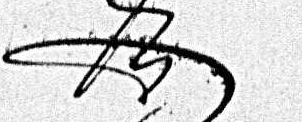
FJ
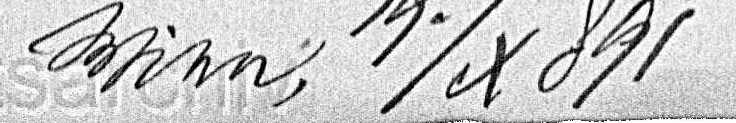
Wien, 19. X. 1891
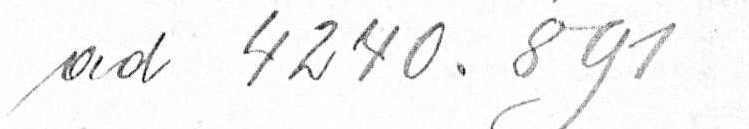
ad 4240 – 1891
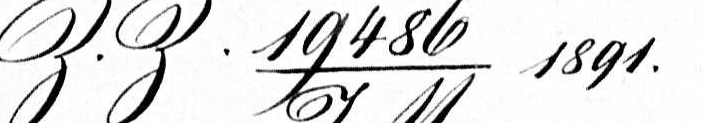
ad Z. 19486/ 1891
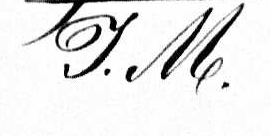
J.M.
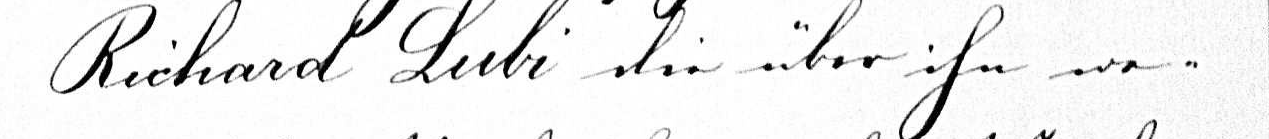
Richard Lubi die über ihn we¬
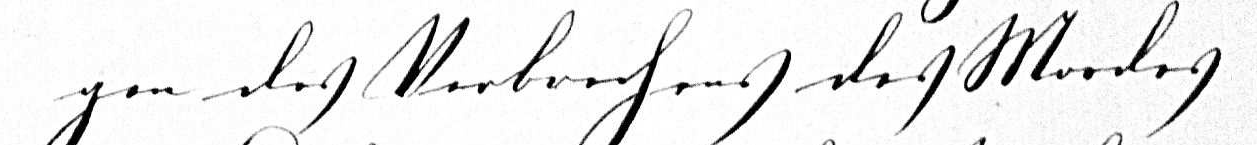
gen des Verbrechens des Mordes,
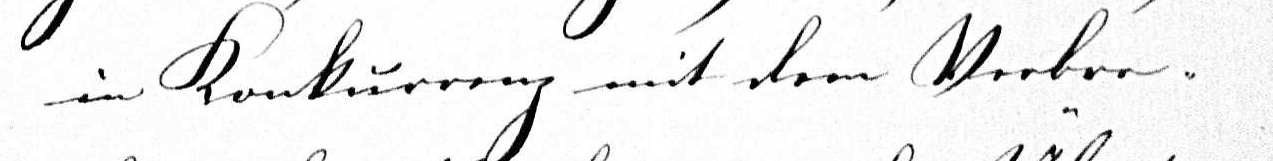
in Concurrenz mit dem Verbre¬
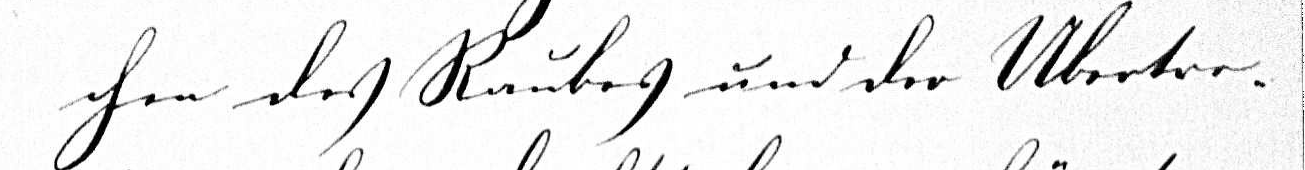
chen des Raubes und der Übertre¬
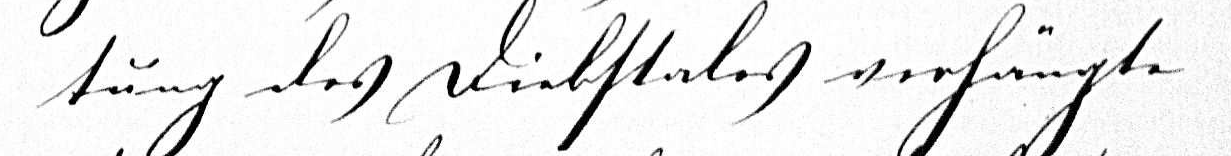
tung des Diebstahles verhängte
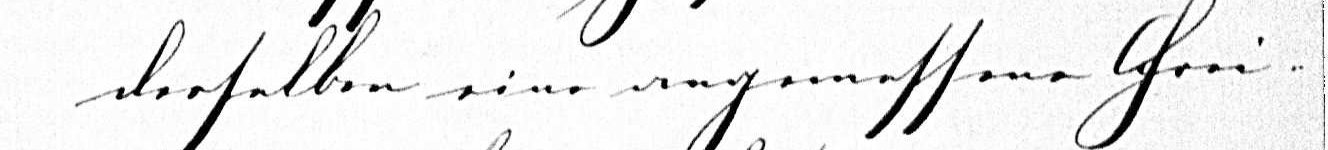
derselben eine angemessene Frei¬
